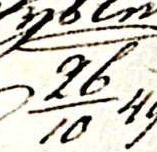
26
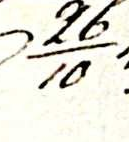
10
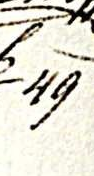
49
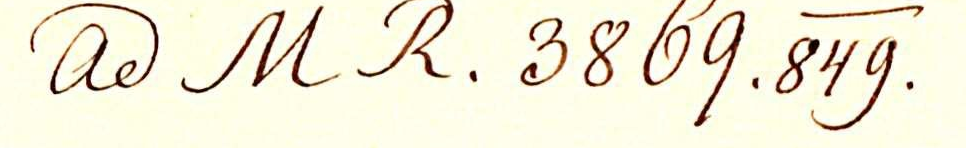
Ad M R. 3869. 849.
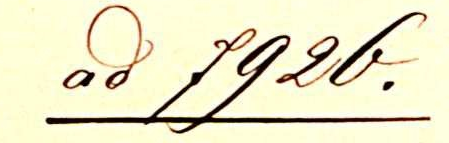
ad 7926.
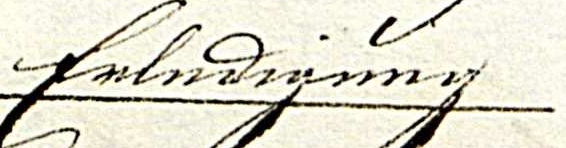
Erledigung
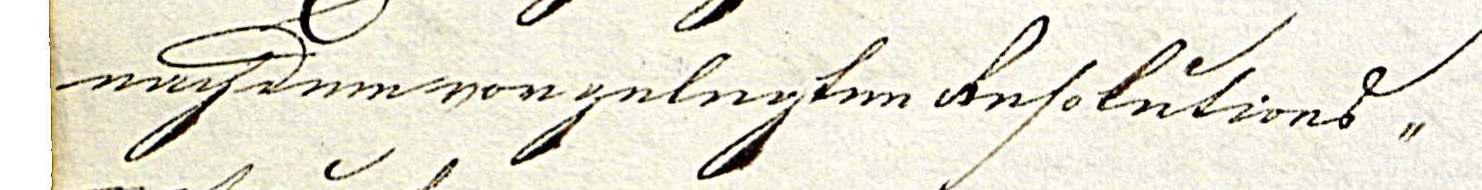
nach dem von gelegten Resolutions=
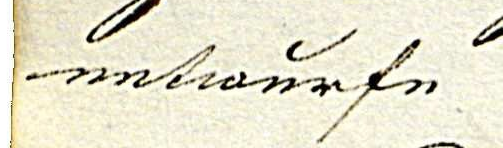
entwurfe
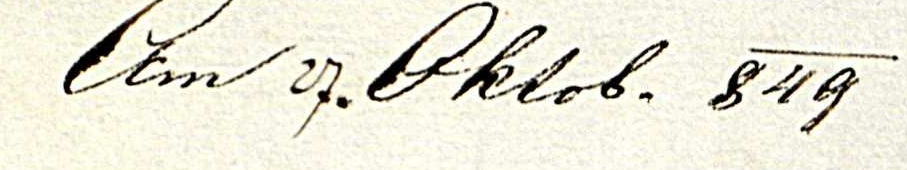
Am 27. Oktob. 849
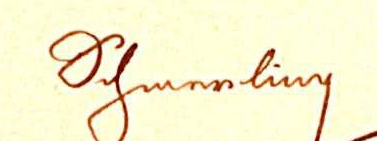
Schmerling
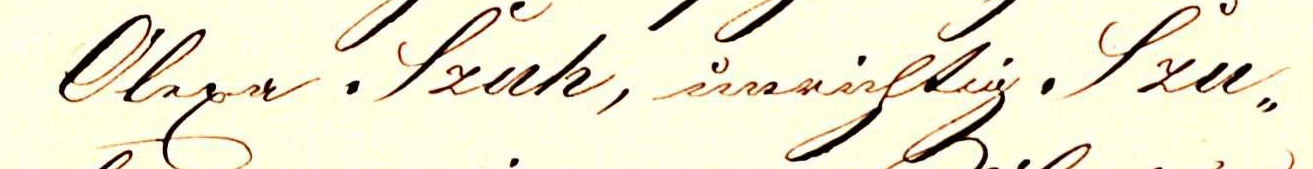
Olexa Szuh, unrichtig Szu¬
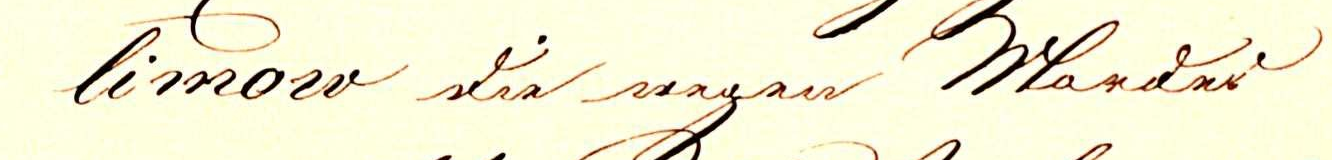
limow die wegen Mordes
